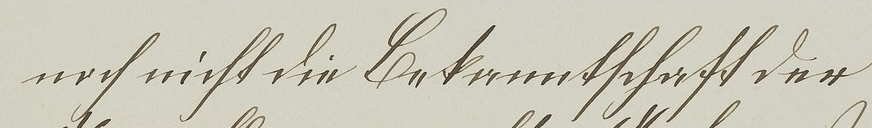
noch nicht die Bekanntschaft der
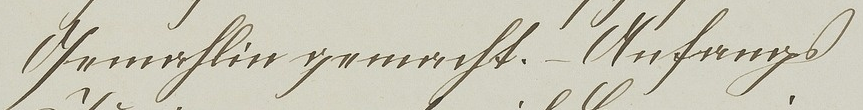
Gemahlin gemacht. – Anfangs
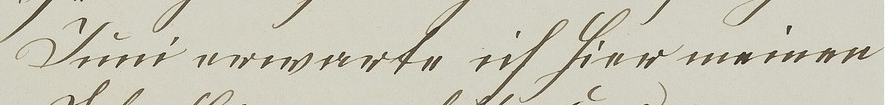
Juni erwarte ich hier meinen
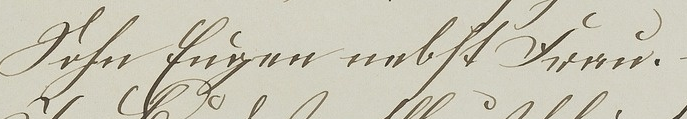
Sohn Eugen nebst Frau.
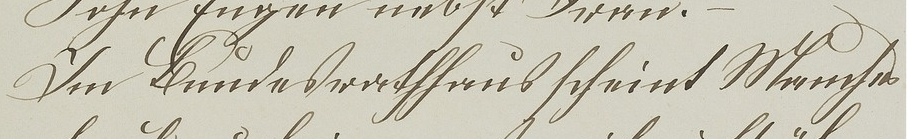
Im Bundesrathhaus scheint Manches
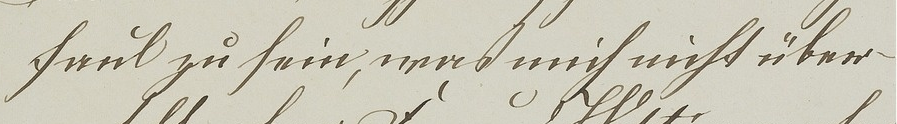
faul zu sein, was mich nicht über-
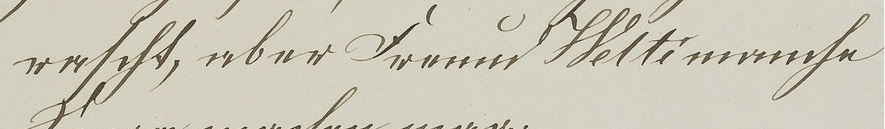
rascht, aber Freund Welti manche
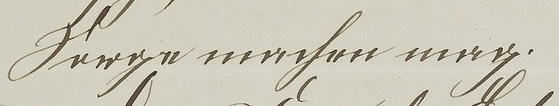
Sorge machen mag.
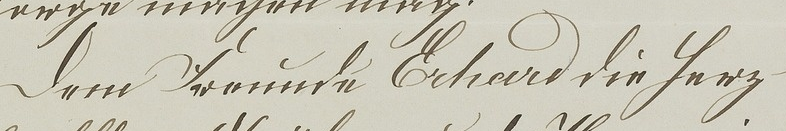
Dem Freunde Erhard die herz-
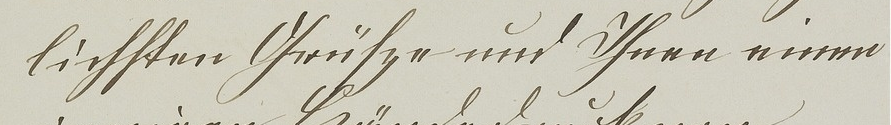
lichsten Grüsze und Ihnen einen
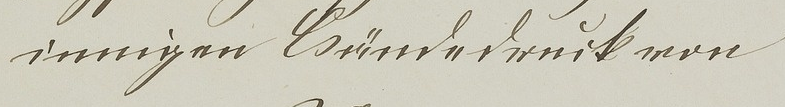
innigen Händedruck von
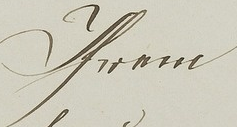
Ihrem
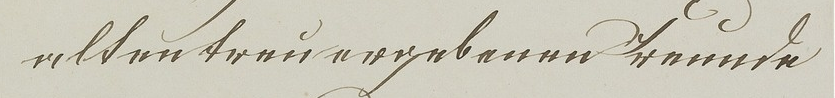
alten treu ergebenen Freunde
